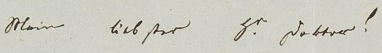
Mein liebster Hr Doktor!
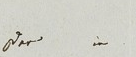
Der in
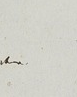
den
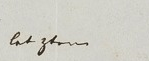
letzten
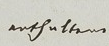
enthaltene
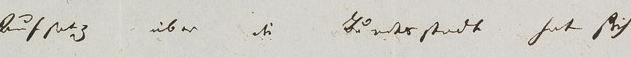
Aufsatz über die Bundesstadt hat sich
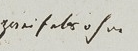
zweifelsohne auch Ihren
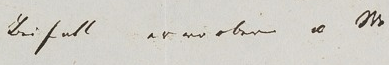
Beifall erworben & Sie
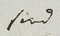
sind
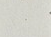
nicht
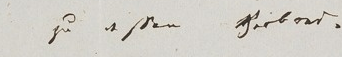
zu dessen Verbrei-
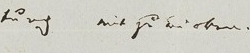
tung mitzuwirken. In dieser
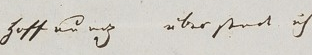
Hoffnung übersende ich
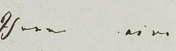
Ihnen eine
